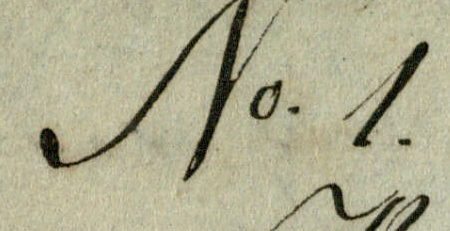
Nº 1.
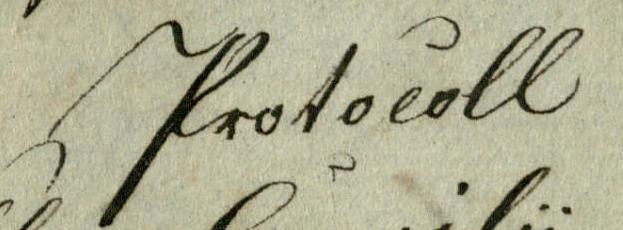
Protocoll
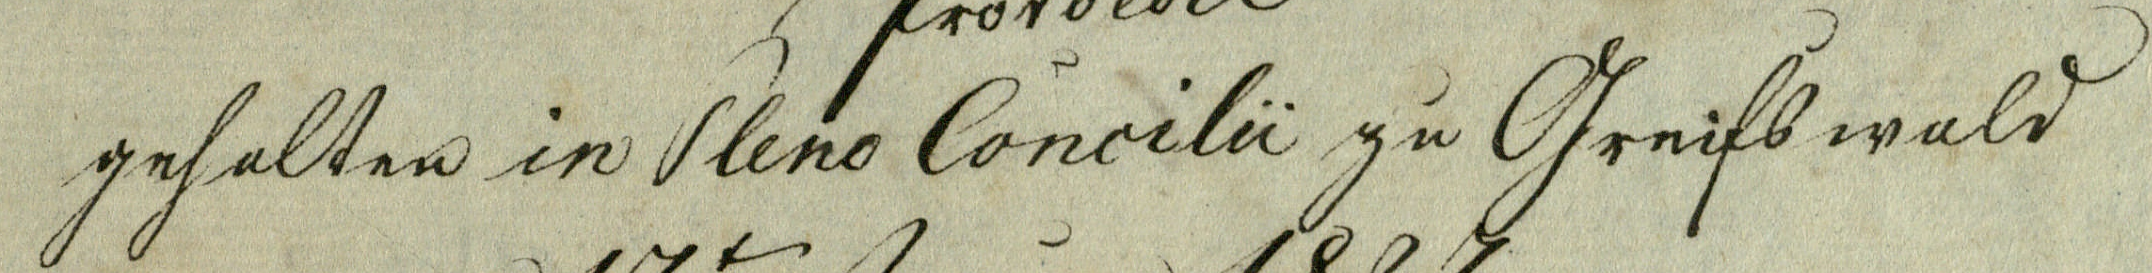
gehalten in Pleno Concilii zu Greifswald
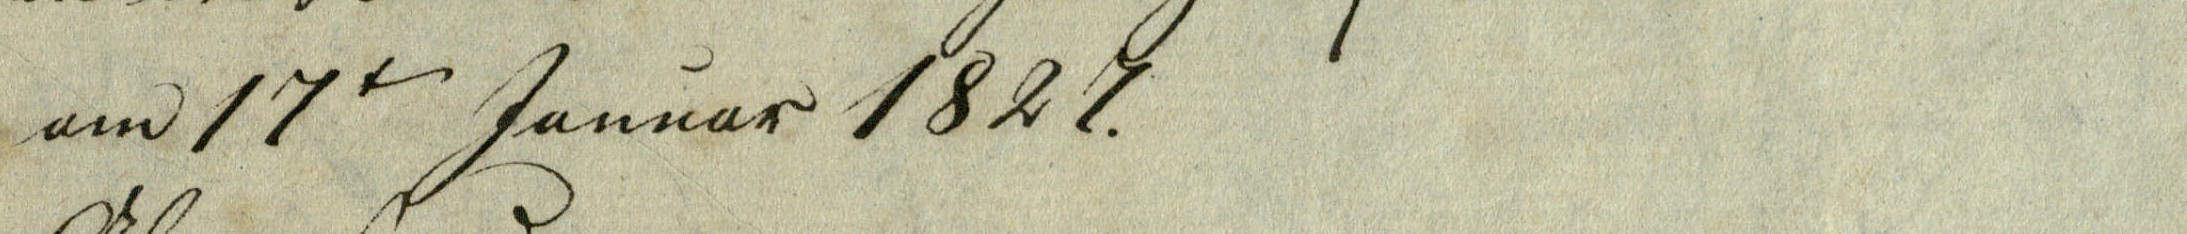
am 17ten Januar 1827
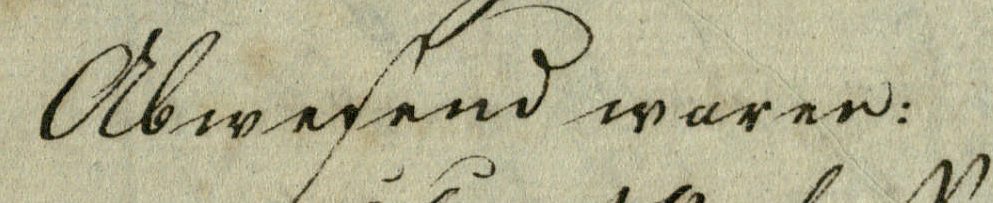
Abwesend waren:
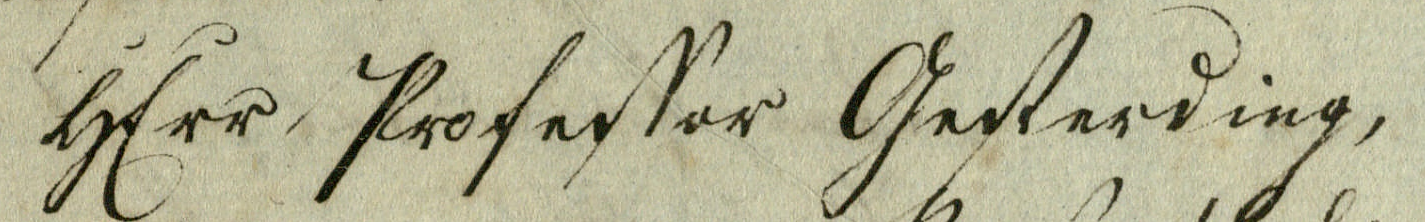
Herr Professor Gesterding,
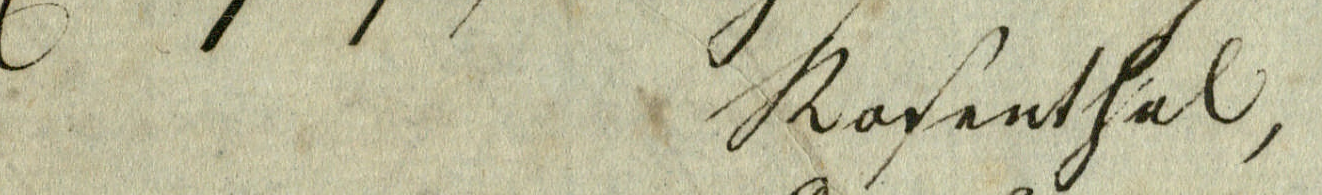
Rosenthal,
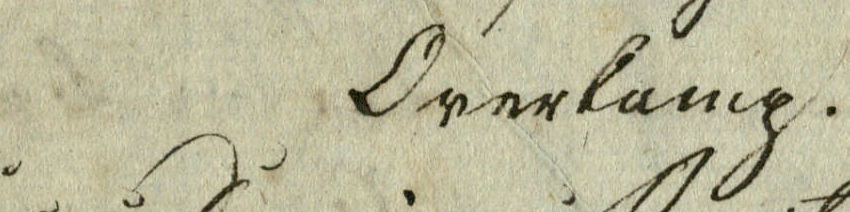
Overkamp.
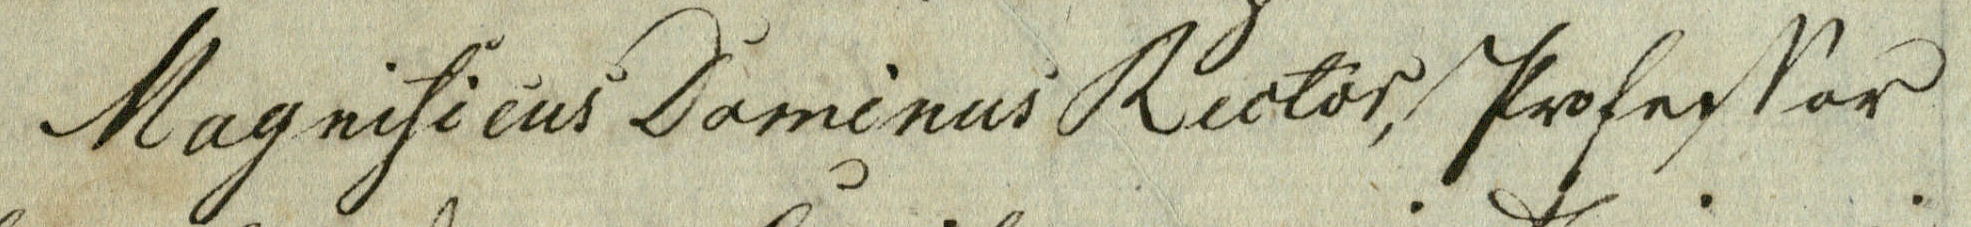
Magnificus Dominus Rector, Professor
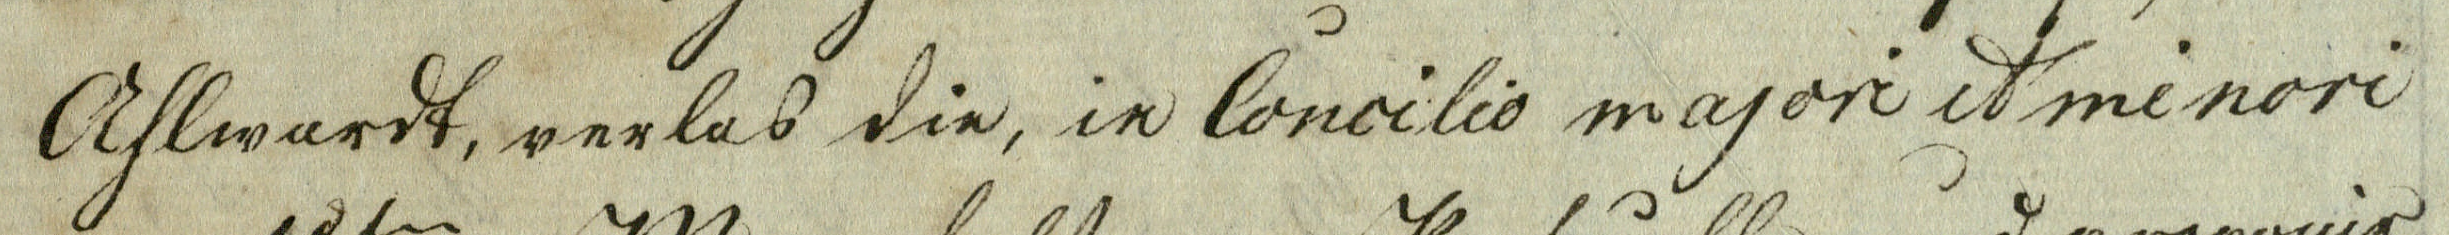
Ahlwardt, verlas die, in Concilio majori et minori
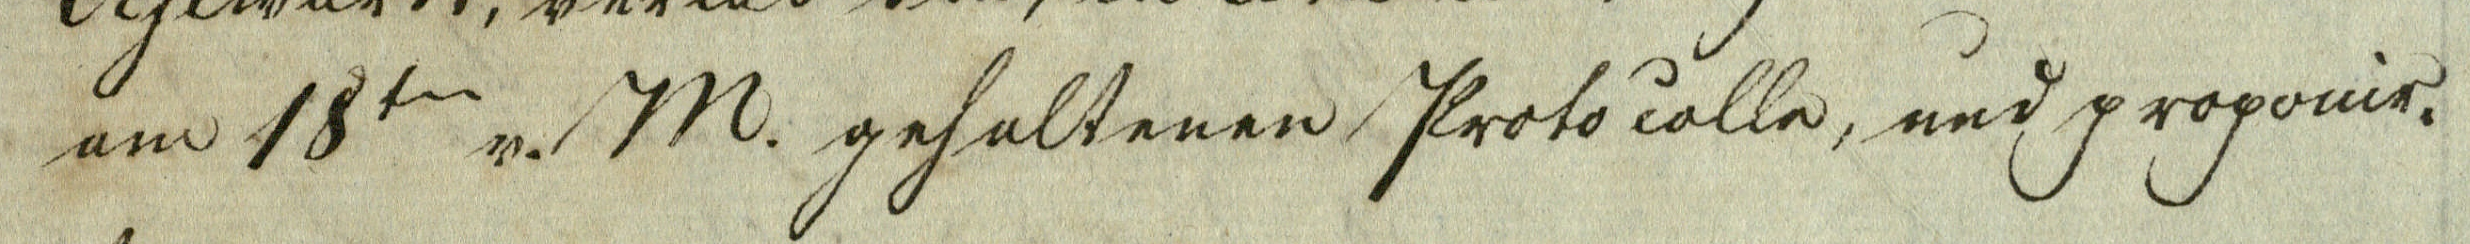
am 18ten v. M. gehaltenen Protocolle, und proponir¬
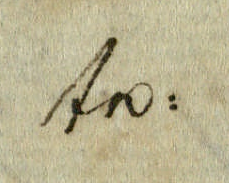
te.
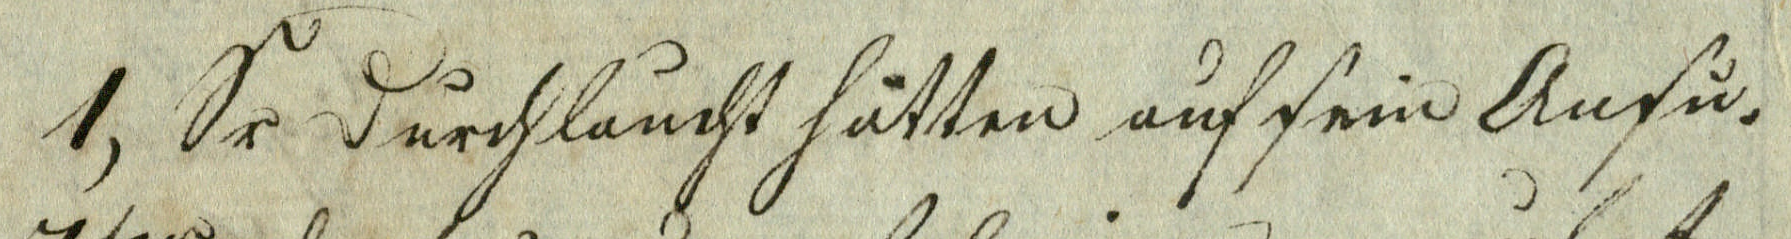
1, Sr Durchlaucht hätten auf sein Ansu¬
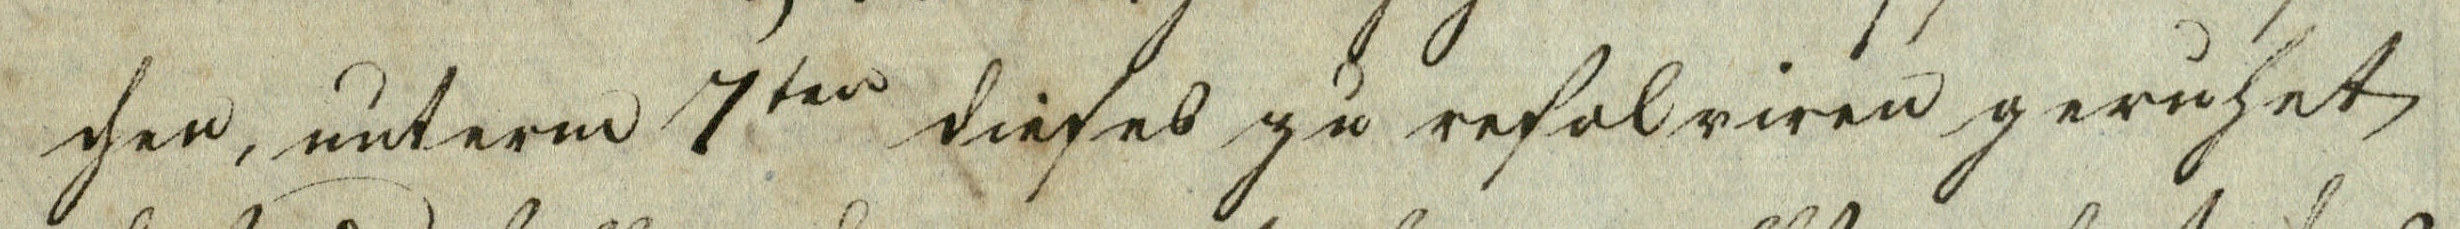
chen, unterm 7ten dieses zu refolviren geruhet,
